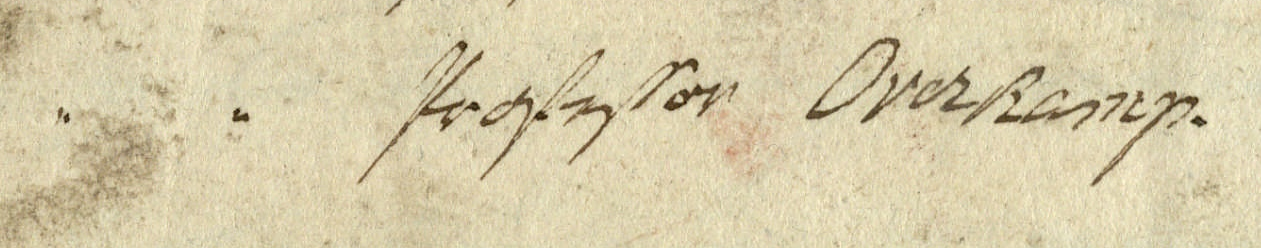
Professor Overkamp.
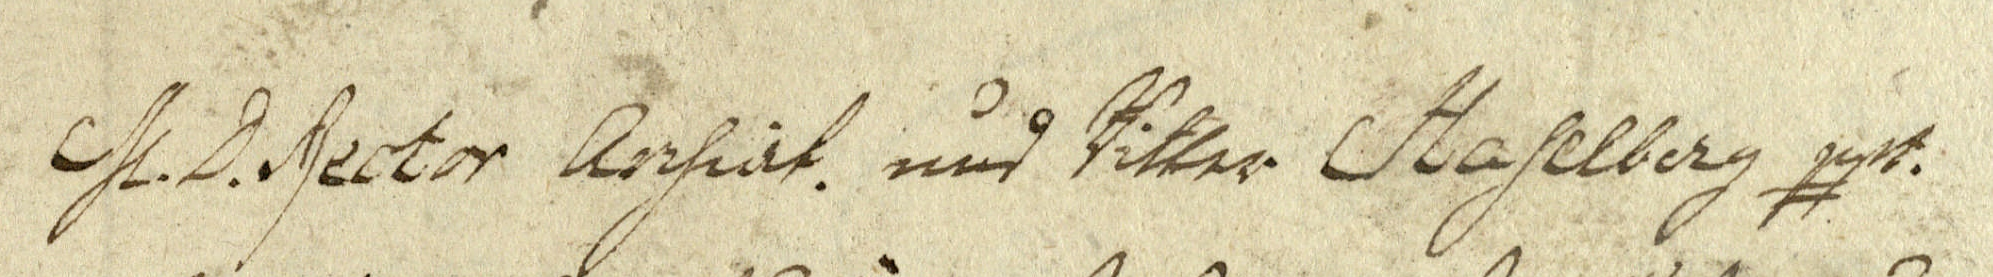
M D. Rector Archiat. und Ritter Haselberg ppt.
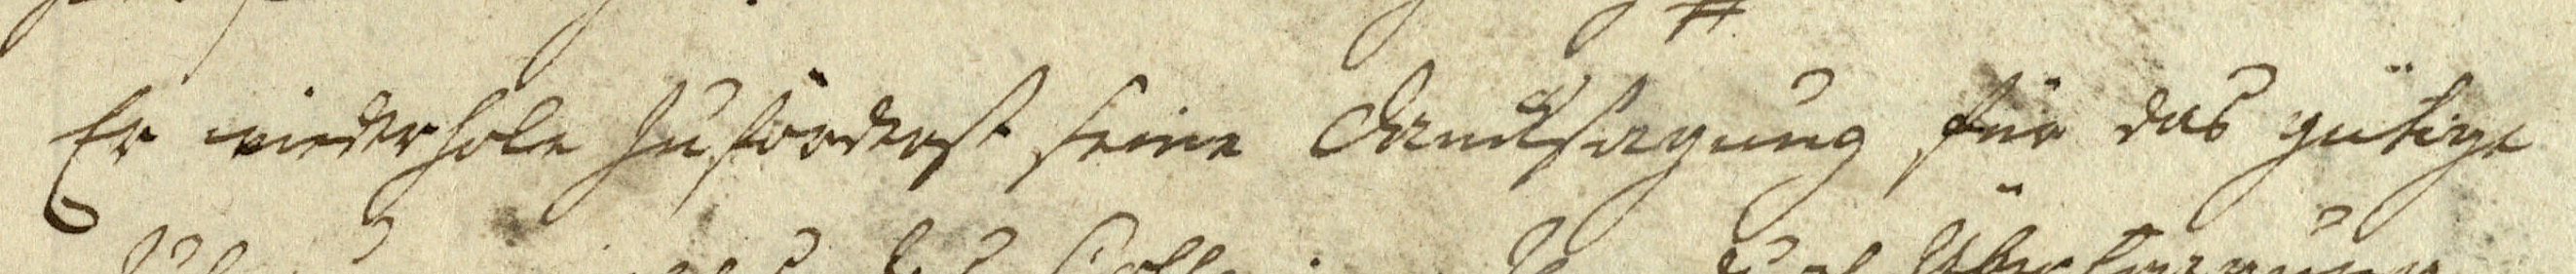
Er wiederhole zuförderst seine Danksagung für das gütige
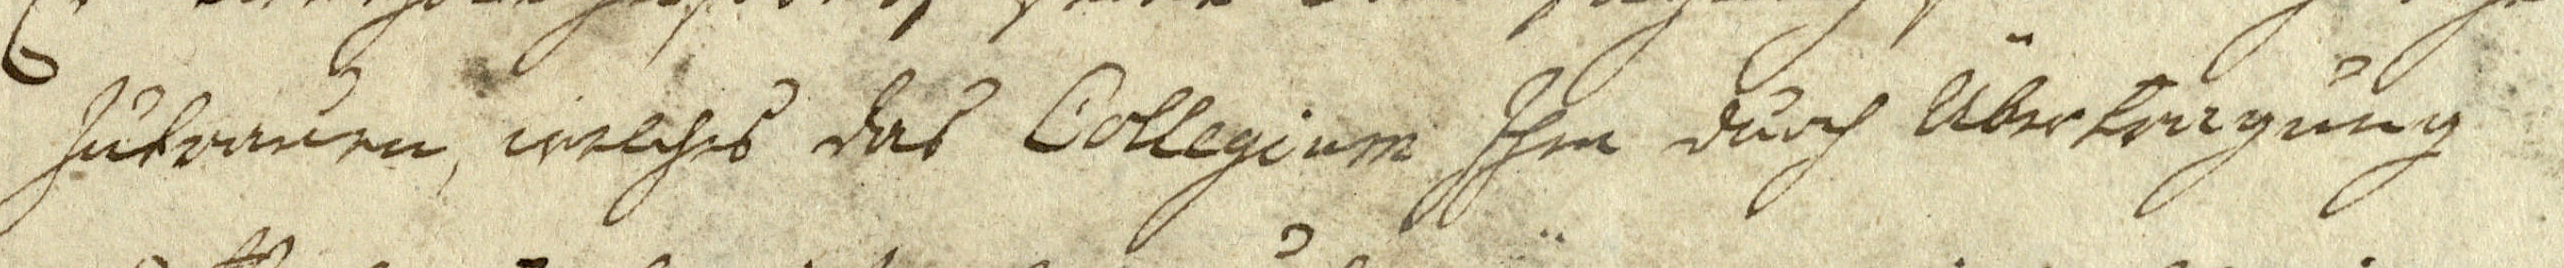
Zutrauen, welches das Collegium Ihm durch Übertragung
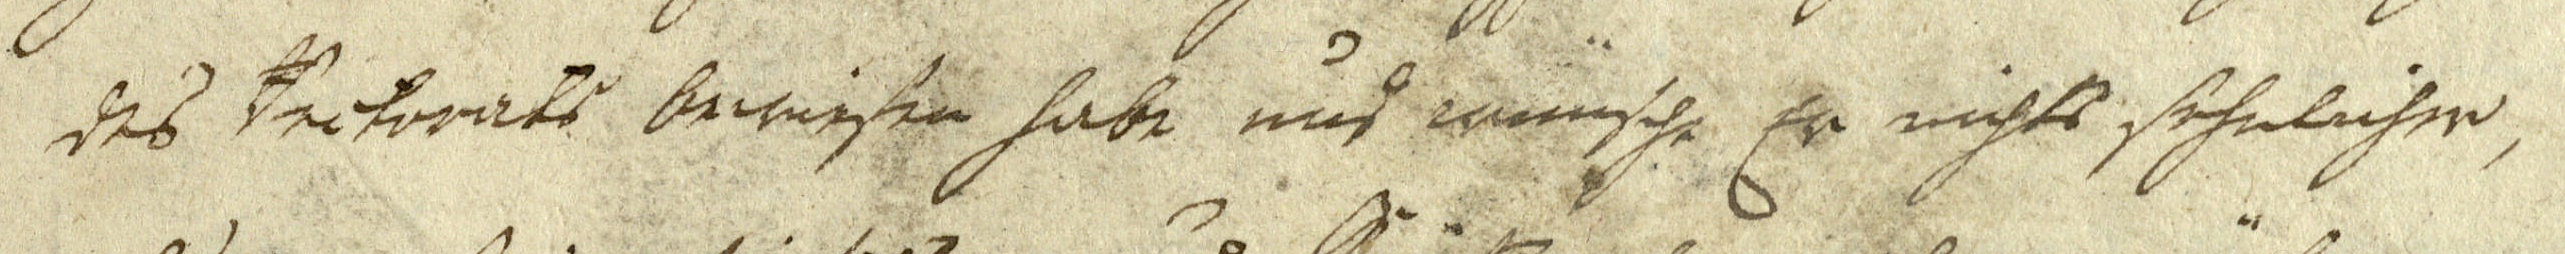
des Rectorats bewiesen habe und wünsche Er nichts sehnlicher,
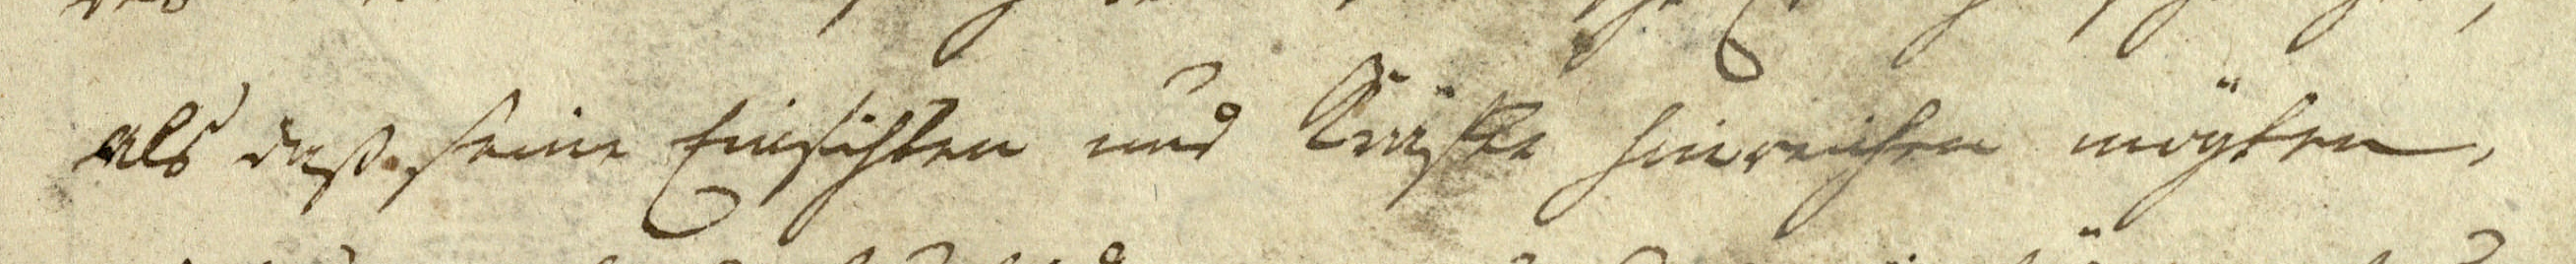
als daß seine Einsichten und Kräfte, hinreichen mögten,
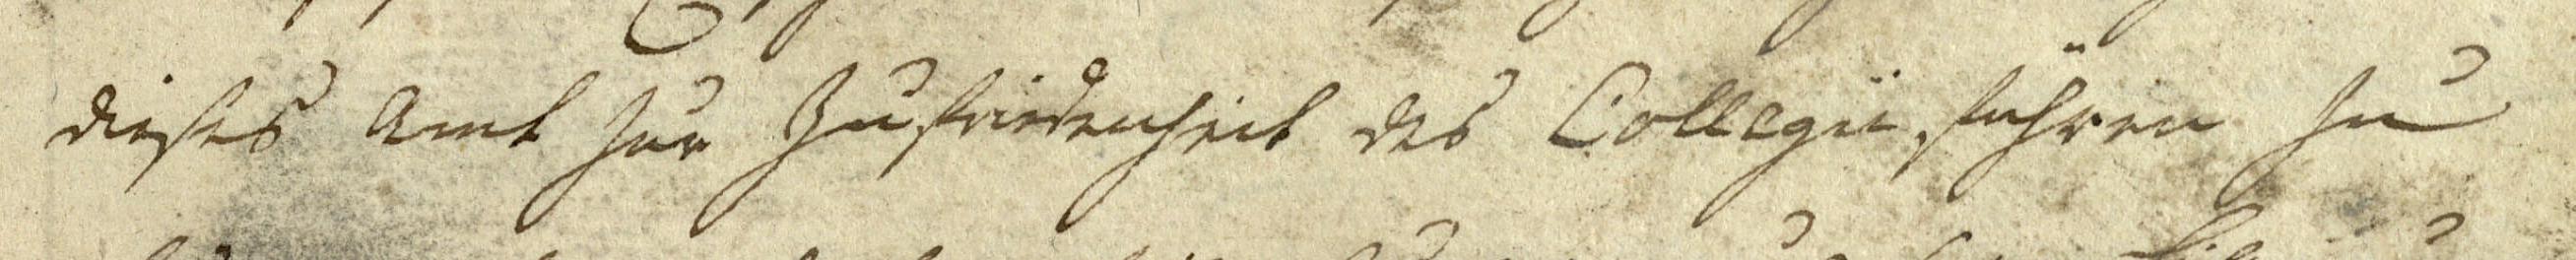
dieses Amt zur Zufriedenheit des Collegii führen zu
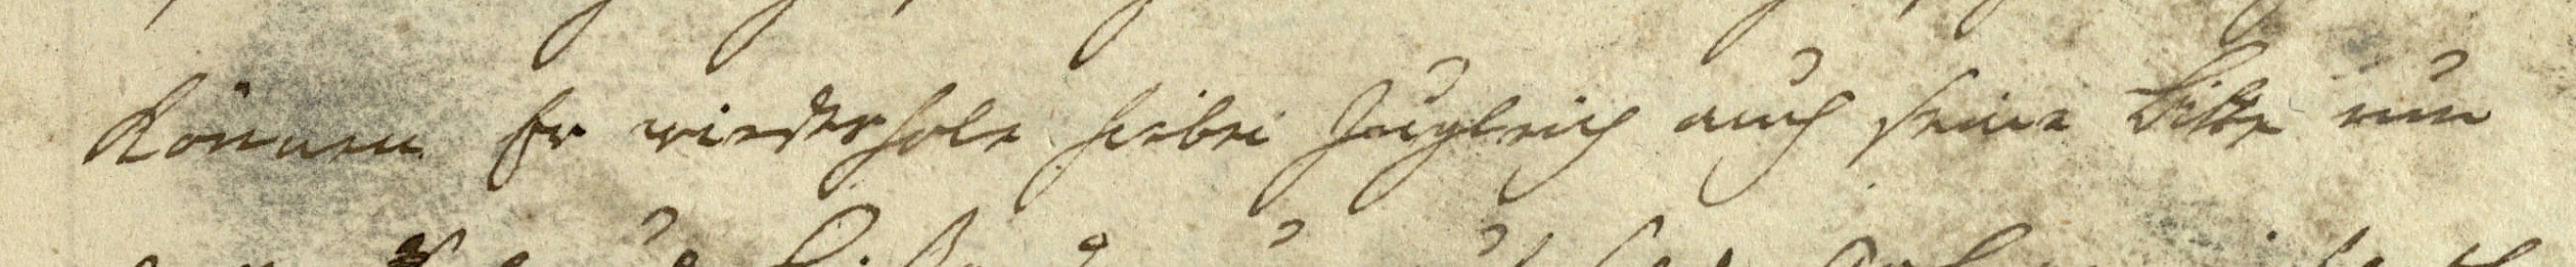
können. Er wiederhole hiebei zugleich auch seine Bitte um
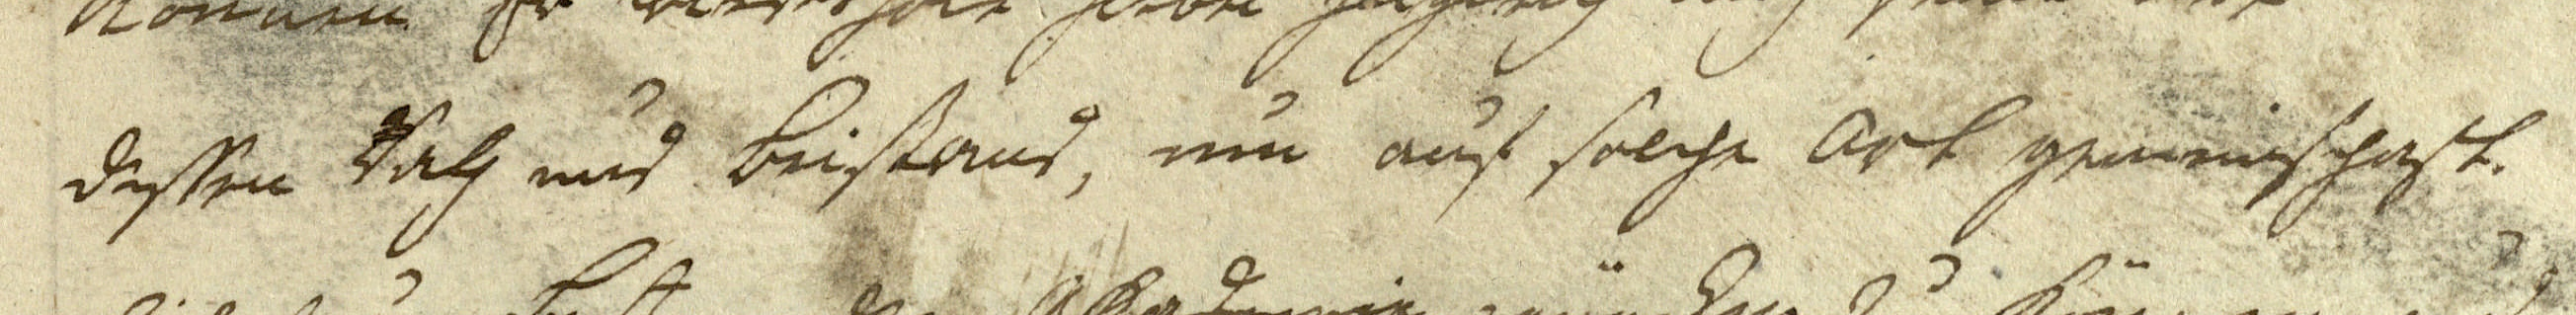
dessen Rath und Beistand, um auf solche Art gemeinschaft¬
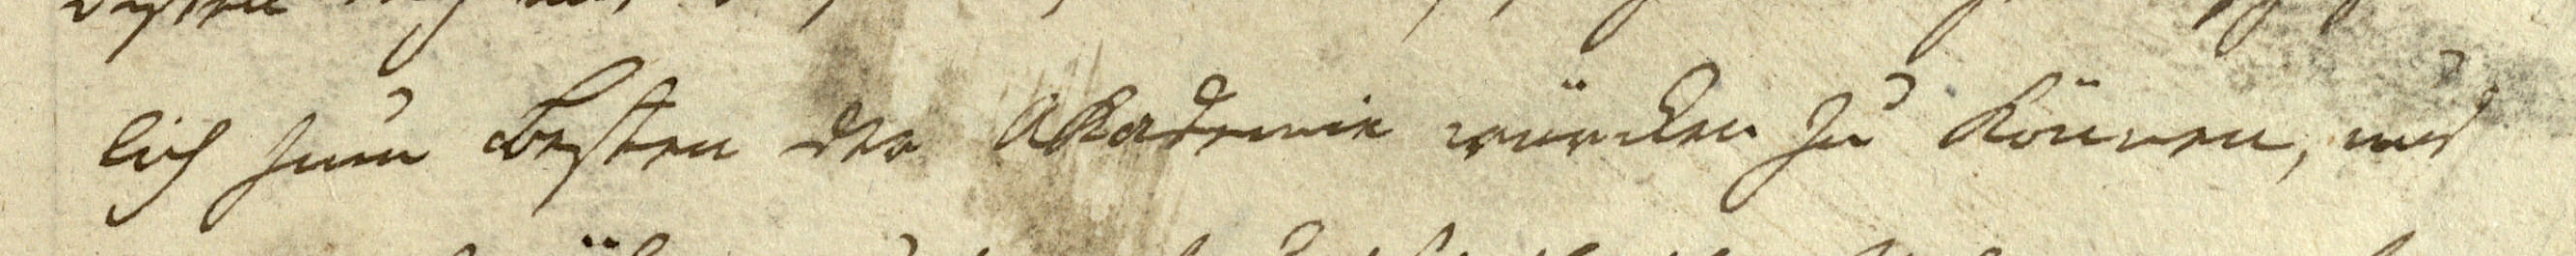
lich zum Besten die Akademie würcken zu können, und
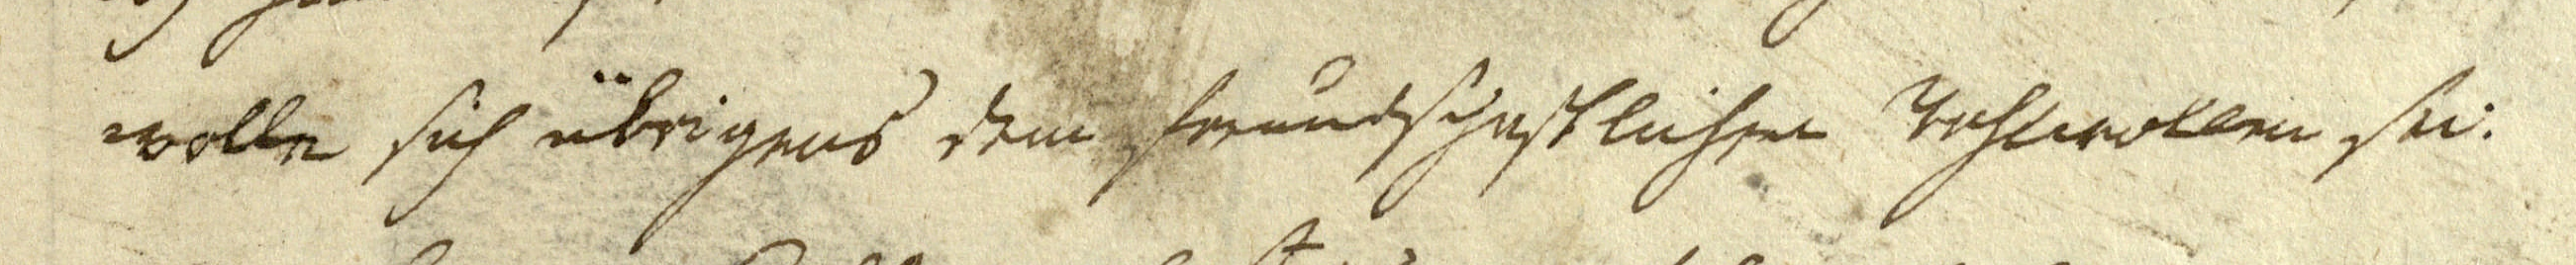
wolle sich übrigens dem freundschaftlichen Wohlwollen sei¬
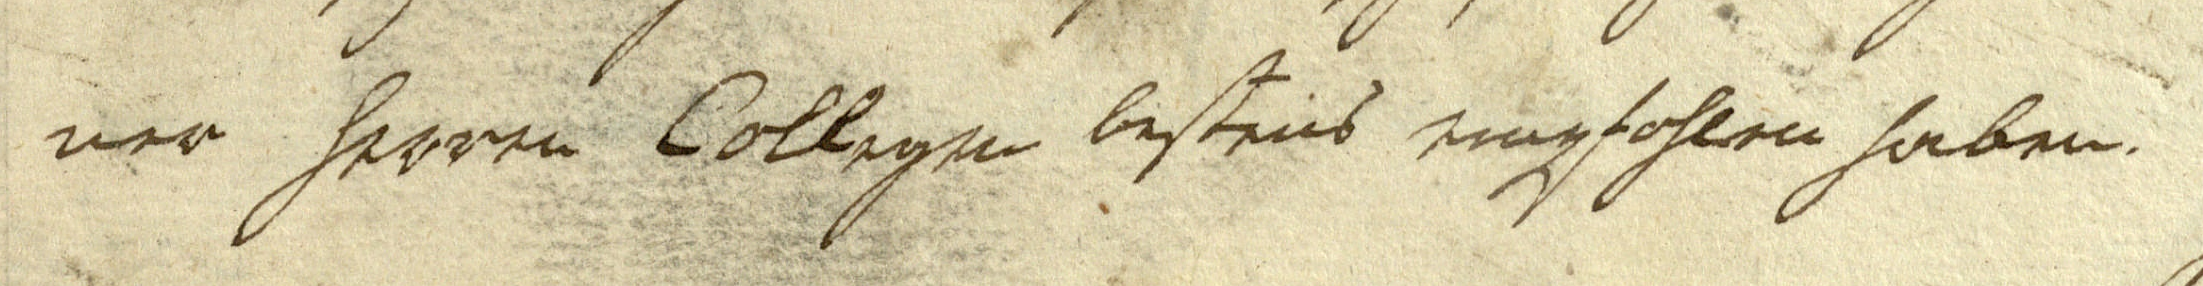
ner Herren Collegen bestens empfohlen haben.
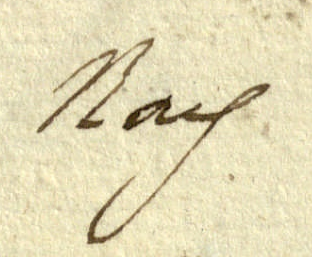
Nach
